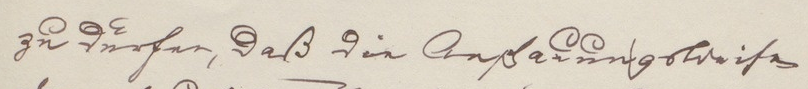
zu dürfen, daß die Anschauungsweise
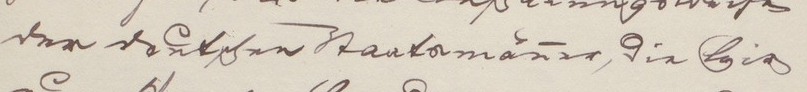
der deutschen Staatsmänner, die wir
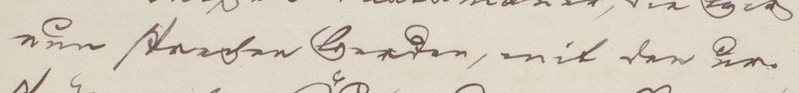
nun sprechen werden, mit den ur-
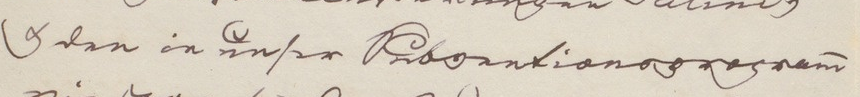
& den in unser Subventionsprogramm
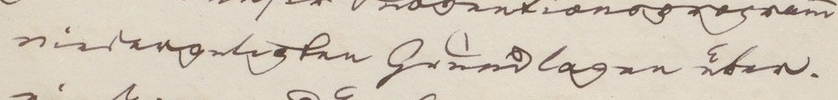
niedergelegten Grundlagen über-
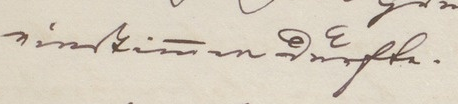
einstimmen dürfte.
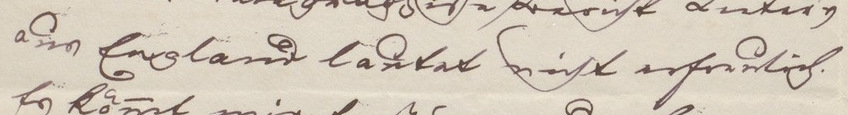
aus England lautet nicht erfreulich.
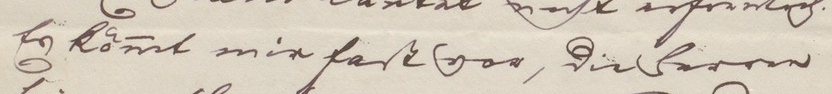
Es kömmt mir fast vor, die Herren
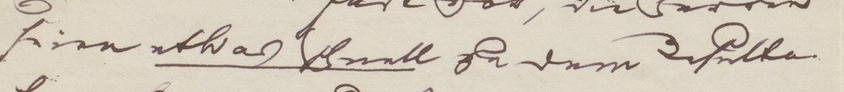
seien etwas schnell zu dem Resulta-
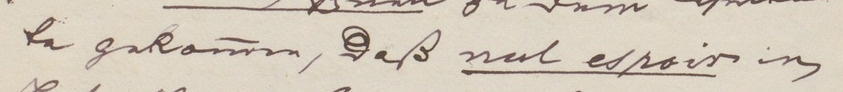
te gekommen, daß nul espoir in
